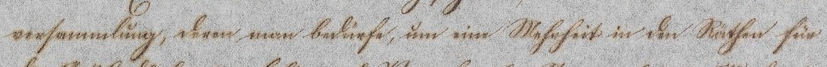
versammlung, deren man bedürfe, um eine Mehrheit in den Räthen für
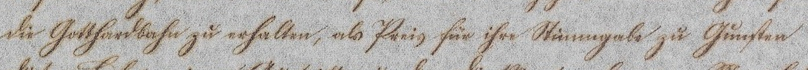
die Gotthardbahn zu erhalten, als Preis für ihre Stimmgabe zu Gunsten
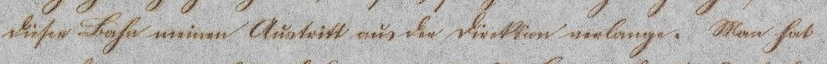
dieser Bahn meinen Austritt aus der Direktion verlange. Man hat
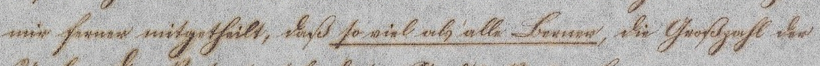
mir ferner mitgetheilt, daß so viel als alle Berner, die Großzahl der
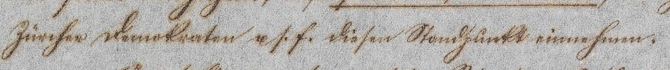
Zürcher Demokraten u. s. f. diesen Standpunkt einnehmen.
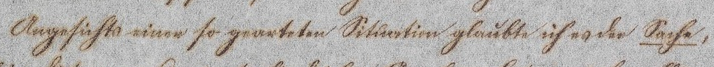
Angesichts einer so gearteten Situation glaubte ich es der Sache,
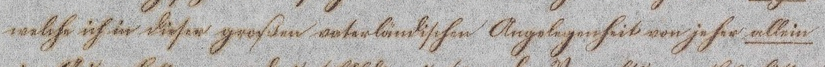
welche ich in dieser großen vaterländischen Angelegenheit von jeher allein
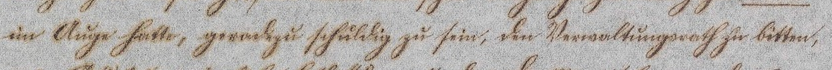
im Auge hatte, geradezu schuldig zu sein, den Verwaltungsrath zu bitten,
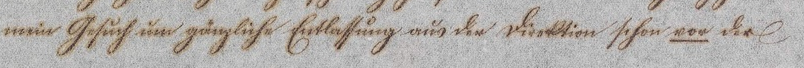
mein Gesuch um gänzliche Entlassung aus der Direktion schon vor der
